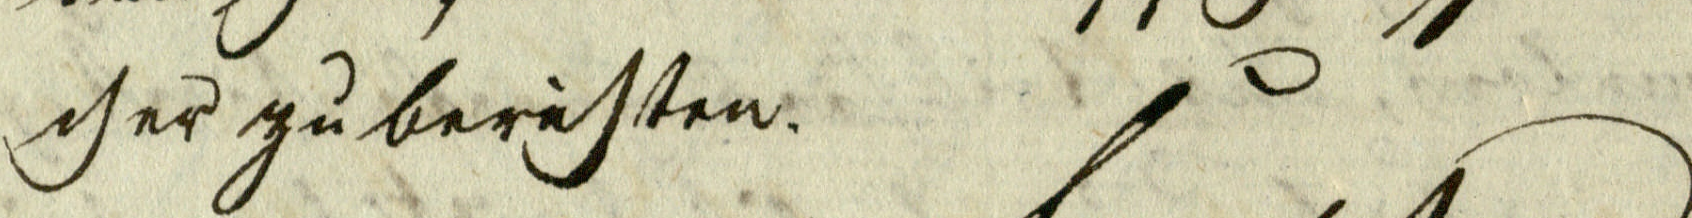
cher zu berichten.
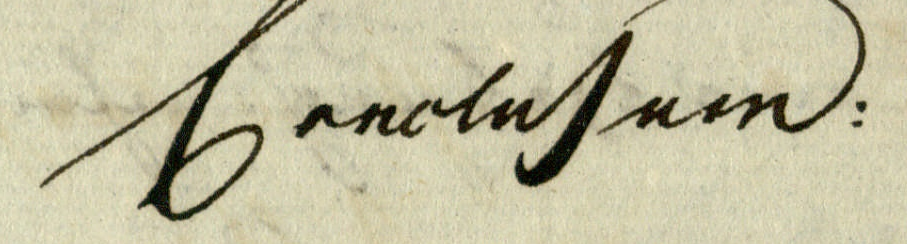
Conclusum:
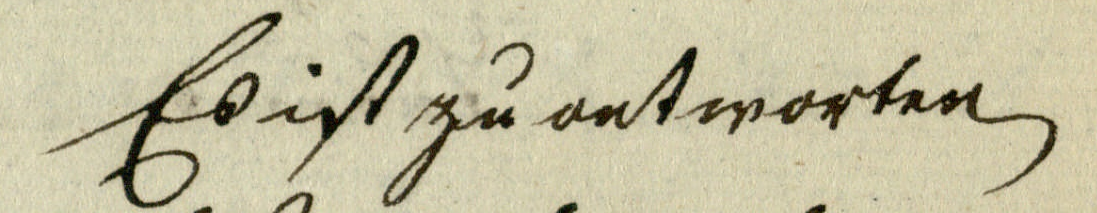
Es ist zu antworten
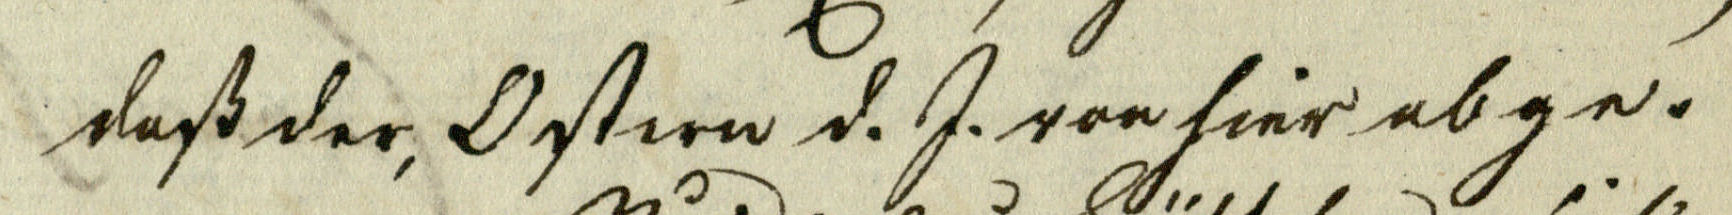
daß der, Ostern d. J. von hier abge¬
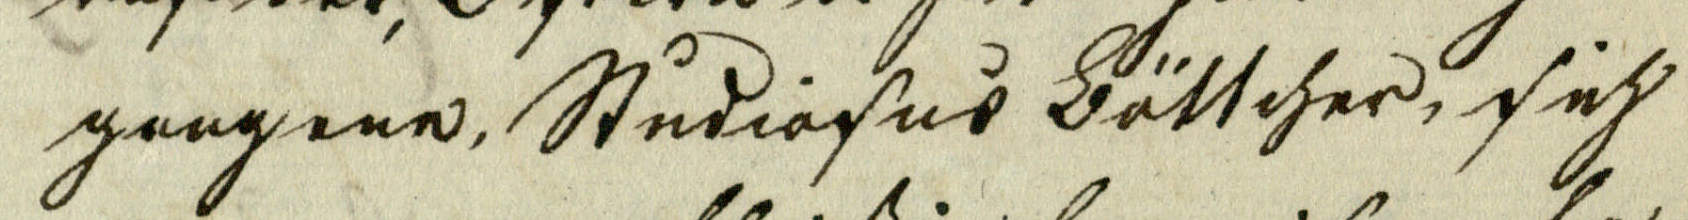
gangene, Studiosus Böttcher, sich
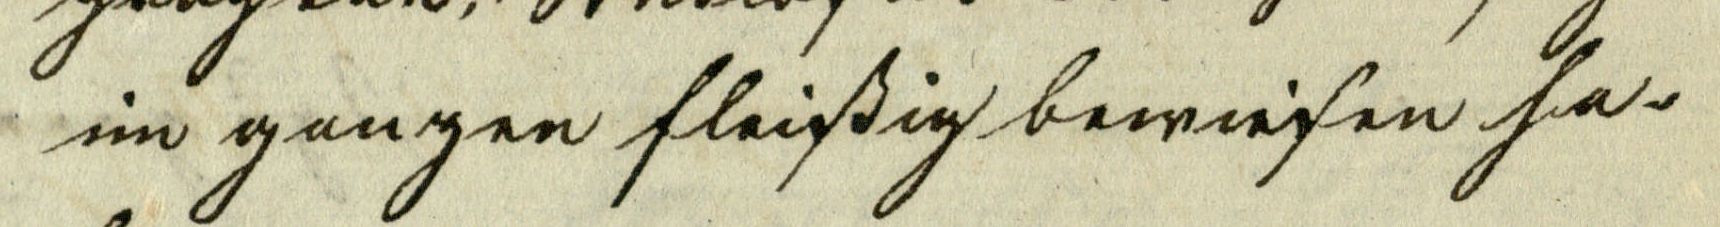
im ganzen fleißig bewiesen ha¬
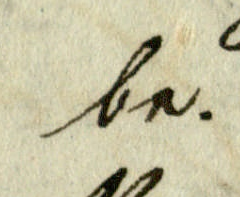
be.
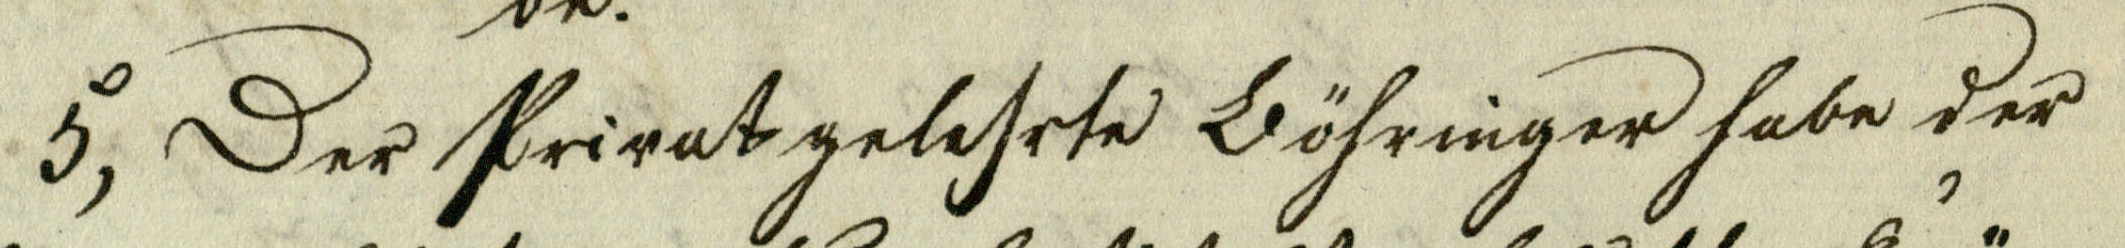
5, Der Privatgelehrte Böhringer habe der
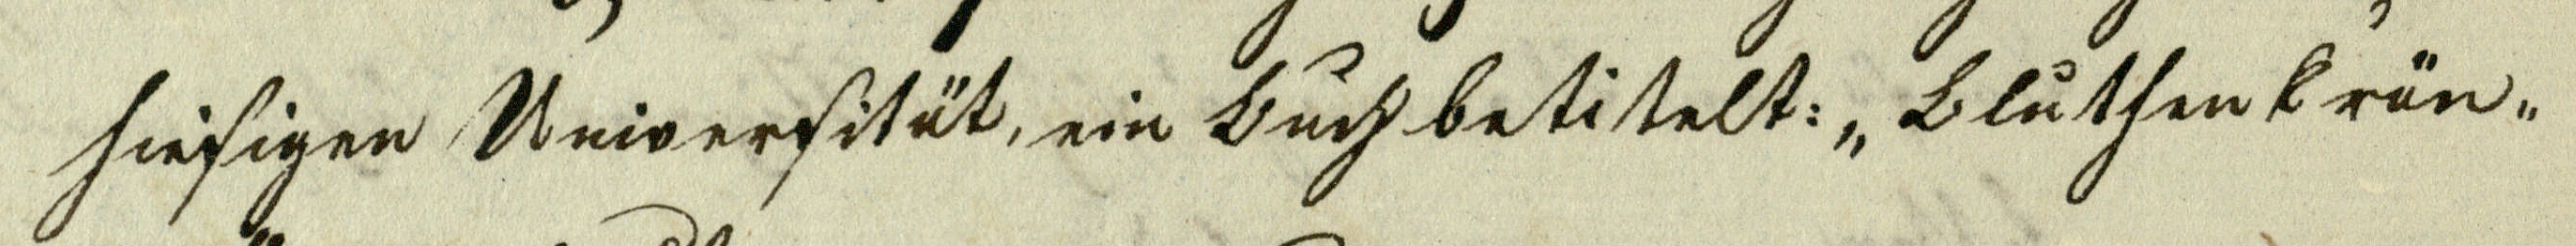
hiesigen Universität, ein Buch betitelt: "Blüthenkrän¬
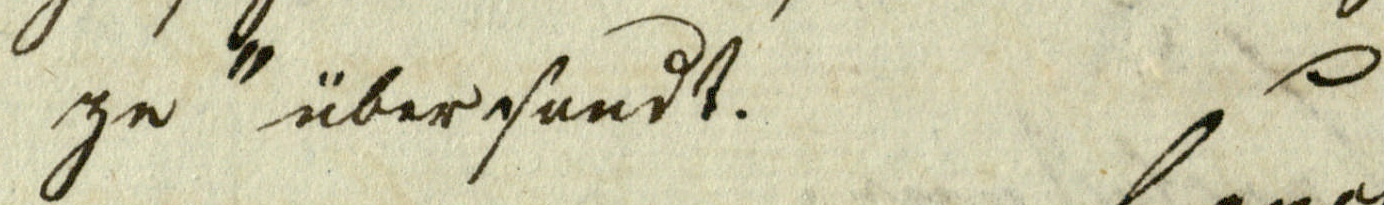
ze" übersandt.
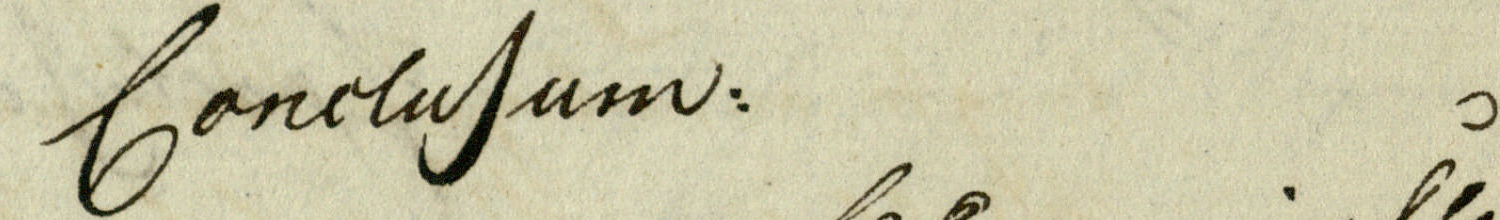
Conclusum:
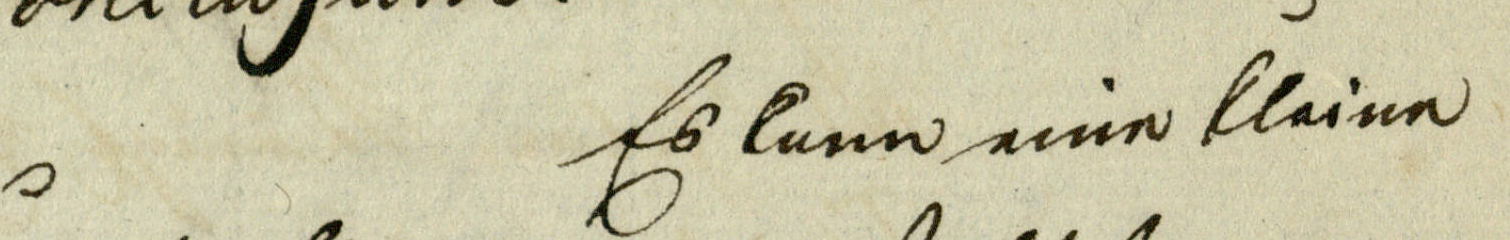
Es kann eine kleine
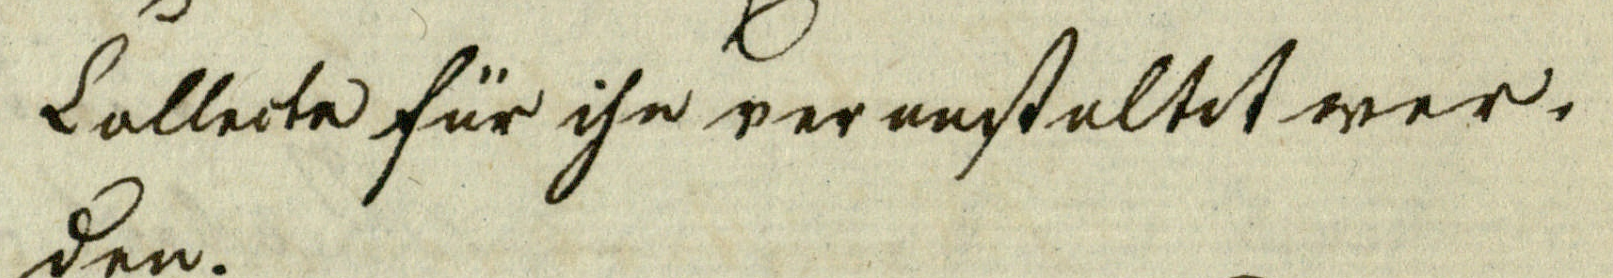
Collecte für ihn veranstaltet wer¬
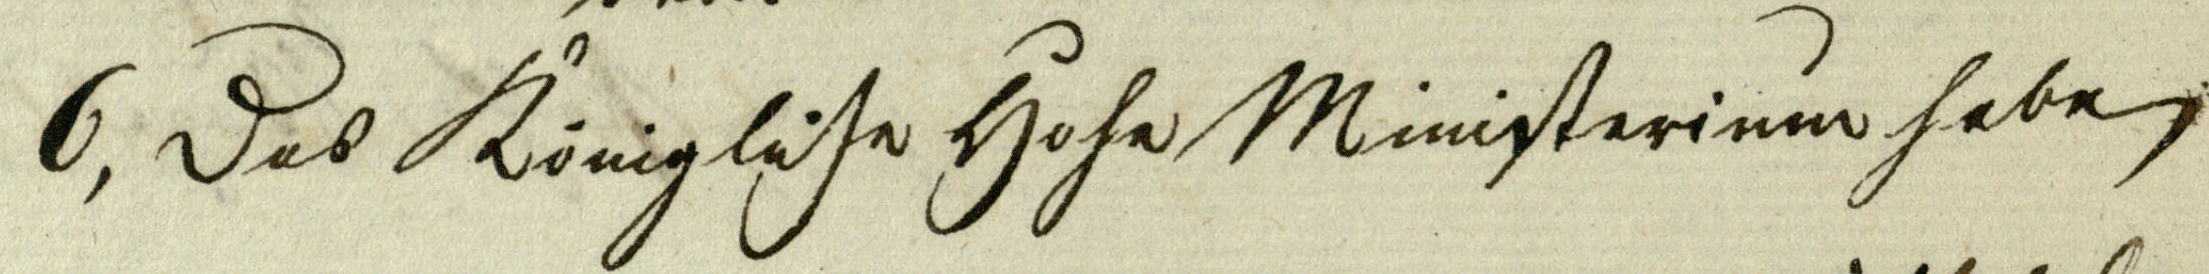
6, Das Königliche Hohe Ministerium habe
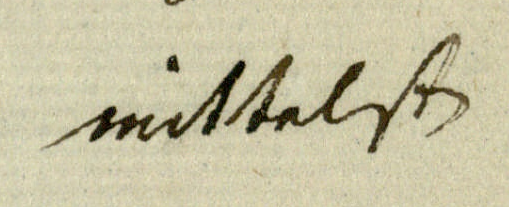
mittelst
